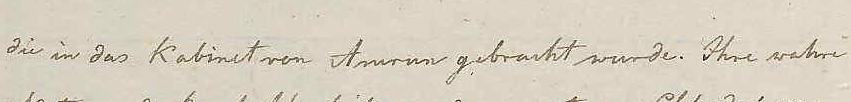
die in das Kabinet von Amrun gebracht wurde. Ihre wahre
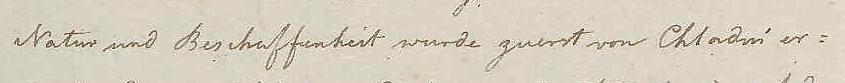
Natur und Beschaffenheit wurde zuerst von Chladni er-
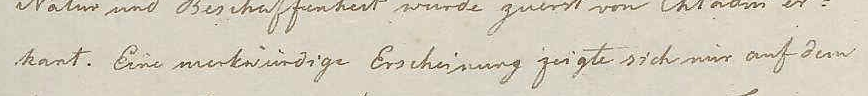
kant. Eine merkwürdige Erscheinung zeigte sich mir auf dem
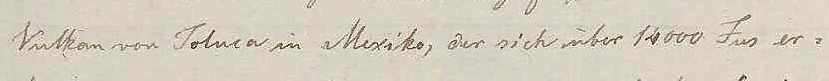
Vulkan von Toluca in Mexiko, der sich über 14000 Fus er-
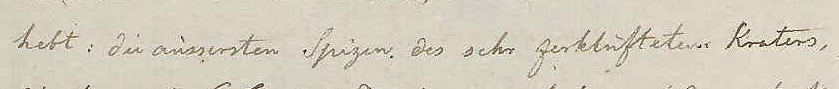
hebt: die äussersten Spizen des sehr zerklüfteten Kraters,
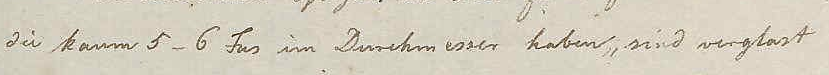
die kaum 5–6 Fus in Durchmesser haben, sind verglast
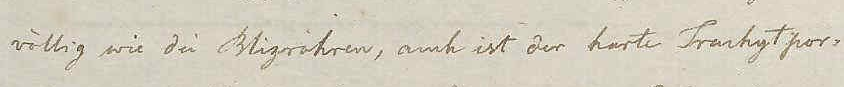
völlig wie die Blizröhren, auch ist der harte Trachytpor-
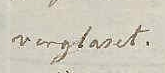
verglaset.
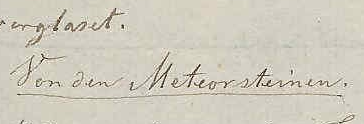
Von den Meteorsteinen.
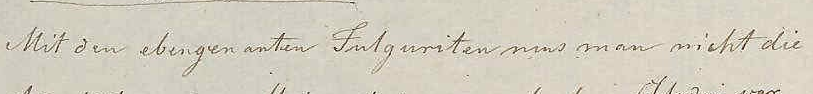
Mit den ebengenanten Fulguriten mus man nicht die
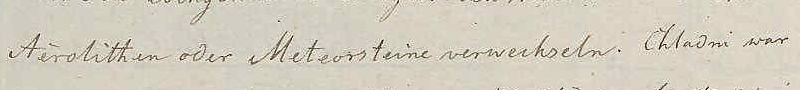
Aërolithen oder Meteorsteine verwechseln. Chladni war
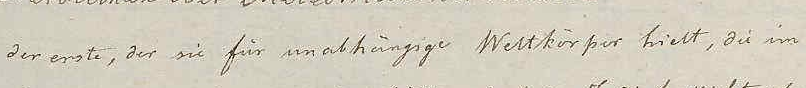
der erste, der sie für unabhängige Weltkörper hielt, die im
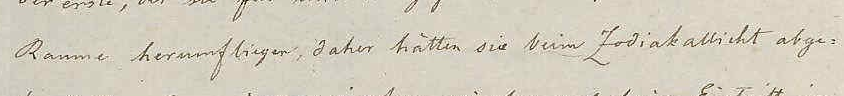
Raume herumfliegen, daher hätten sie beim Zodiakallicht abge-
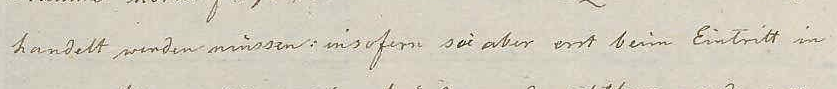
handelt werden müssen: insofern sie aber erst beim Eintritt in
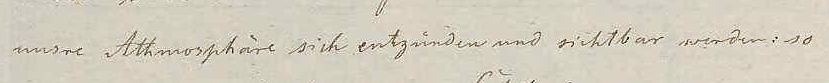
unsre Athmosphäre sich entzünden und sichtbar werden: so
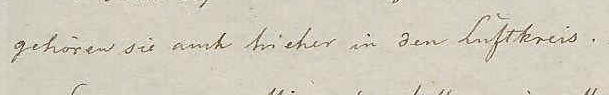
gehören sie auch hieher in den Luftkreis.
